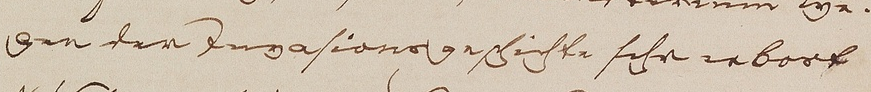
gen der Invasionsgeschichte sehr erbost
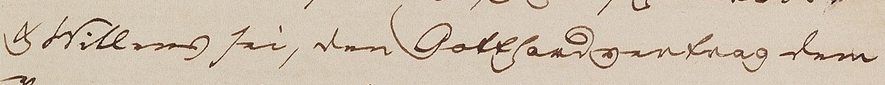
& Willens sei, den Gotthardvertrag dem
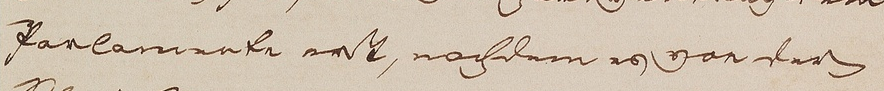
Parlament erst, nachdem es von der
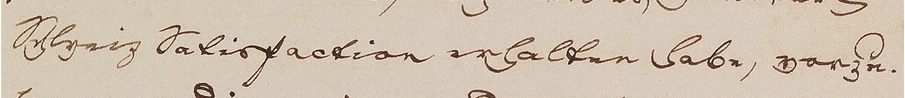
Schweiz Satisfaction erhalten habe, vorzu-
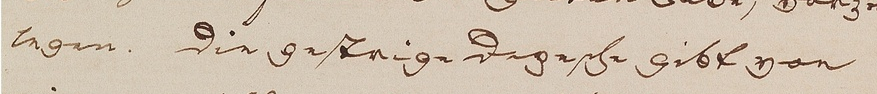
legen. Die gestrige Depesche gibt von
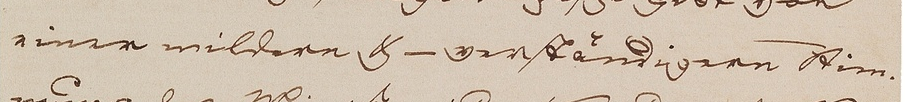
einer mildern & – verständigern Stim-
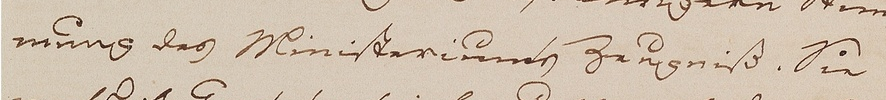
mung des Ministerium's Zeugniß. Sie
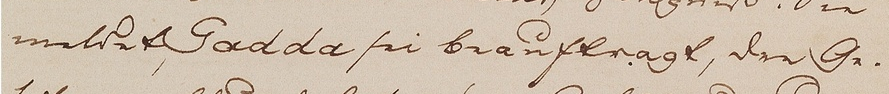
meldet, Gadda sei beauftragt, den Ge-
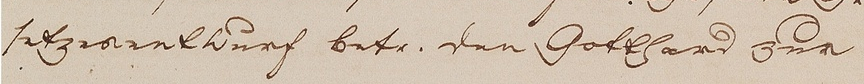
setzesentwurf betr. den Gotthard zur
